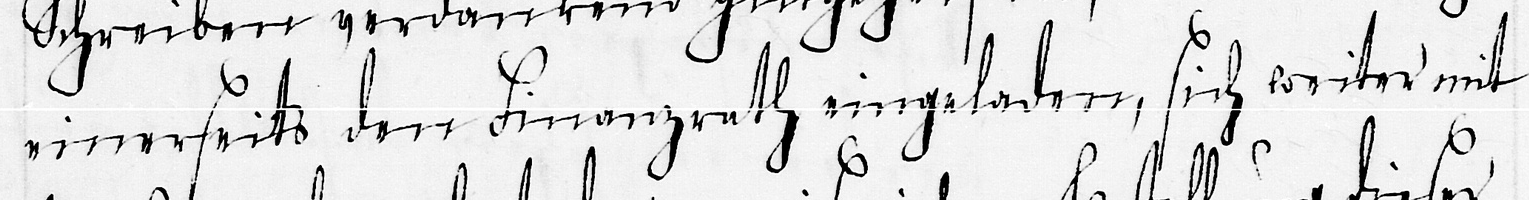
einerseits den Finanzrath eingeladen, sich weiter mit
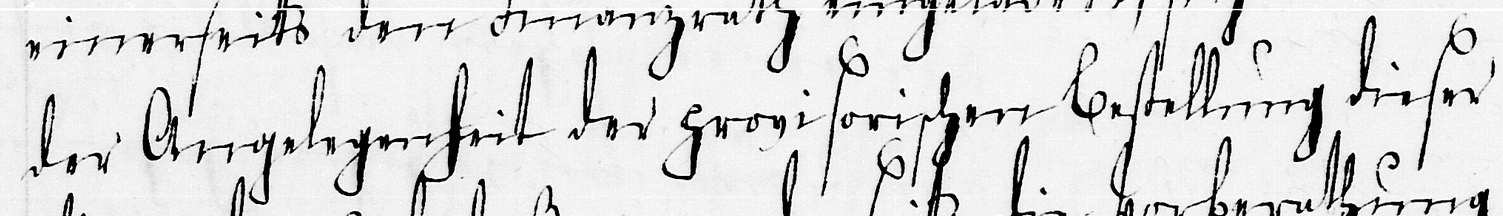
der Angelegenheit der provisorischen Bestellung dieser
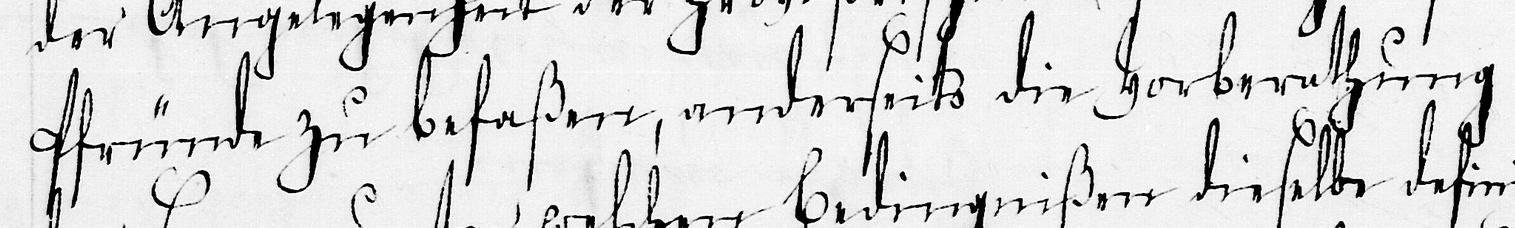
Pfründe zu befaßen, anderseits die Vorberathung
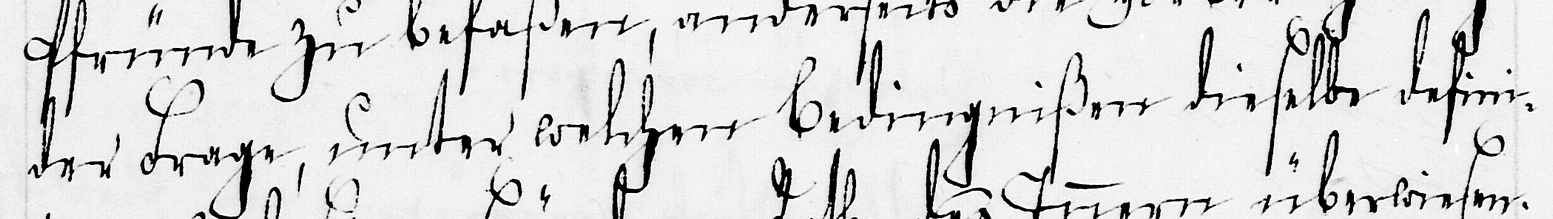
der Frage, unter welchen Bedingnißen dieselbe defin¬
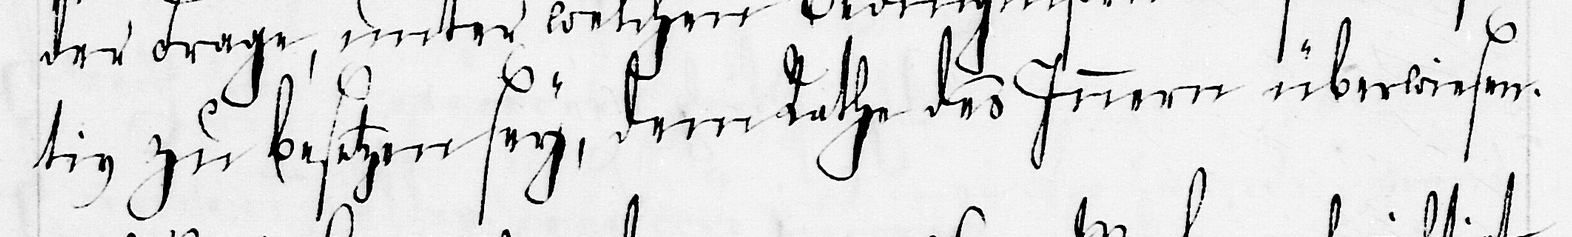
itiv zu besetzen sey, dem Rathe des Innern überwiese¬
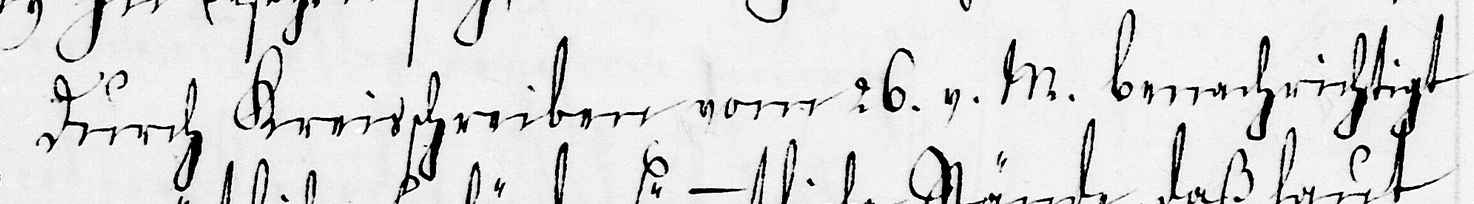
Durch Kreisschreiben vom 26. v. M. benachrichtigt
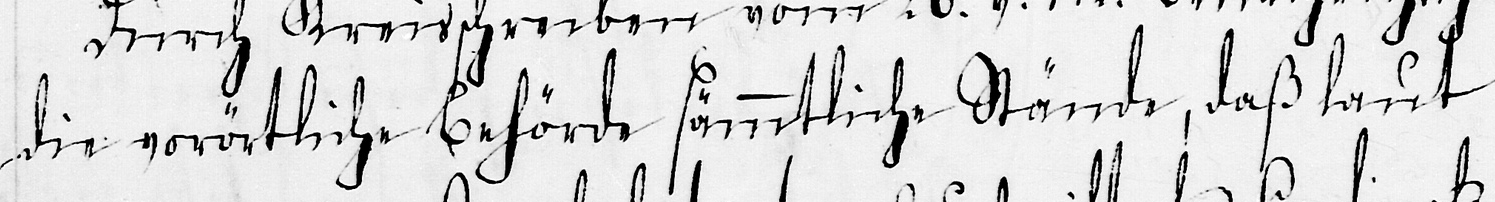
die vorörtliche Behörde sämmtliche Stände, daß laut
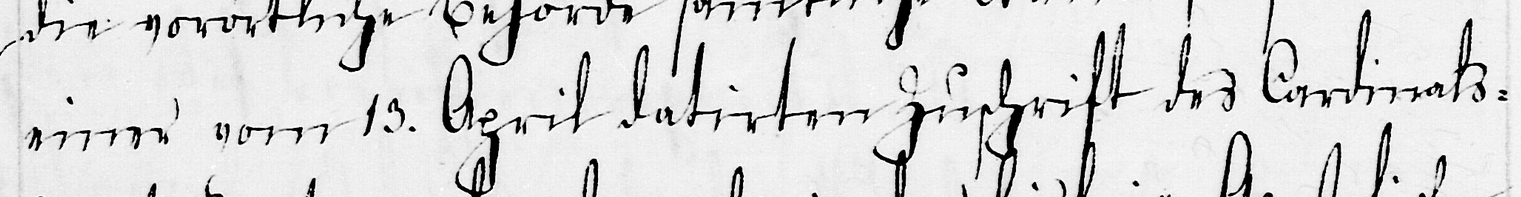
einer vom 13. April datirten Zuschrift des Cardinal¬
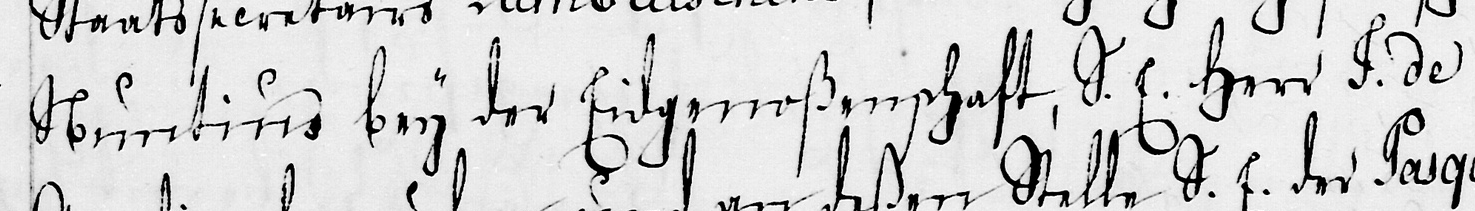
Nuntius bey der Eidgenoßenschaft, S. E. Herr F. de
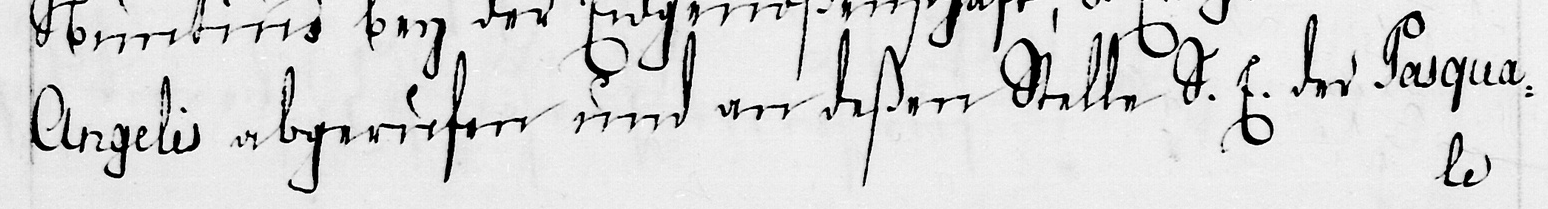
Angelis abgerufen und an deßen Stelle S. E. der Pasqua-
